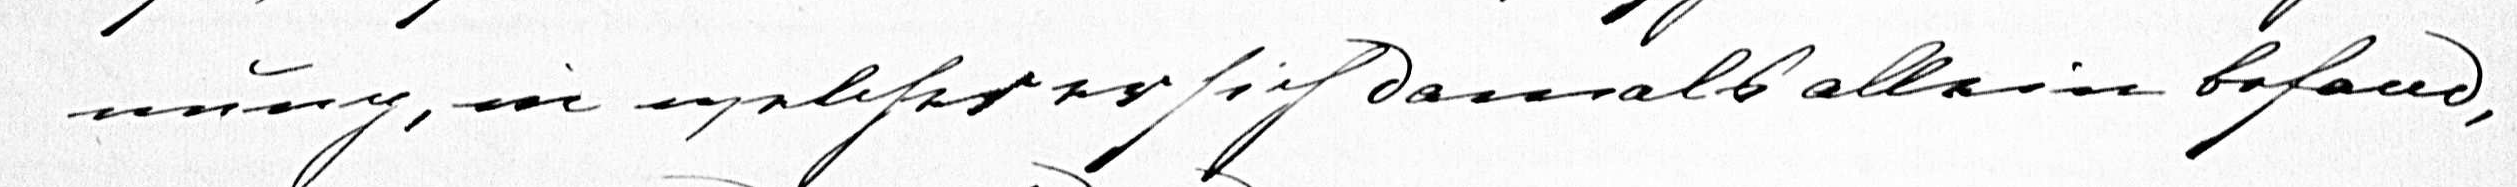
nung, in welcherer sich damals allein befand,
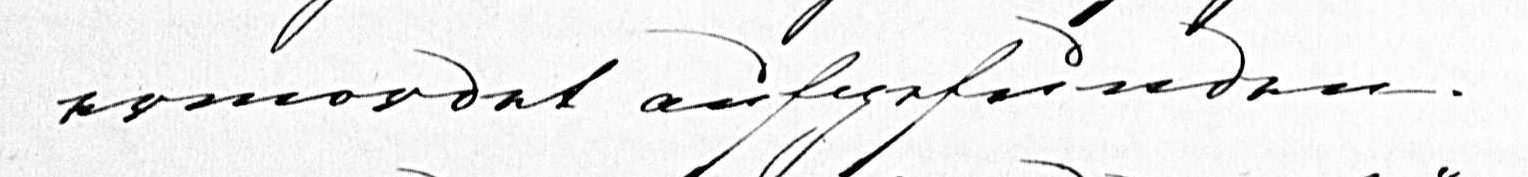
ermordet aufgefunden.
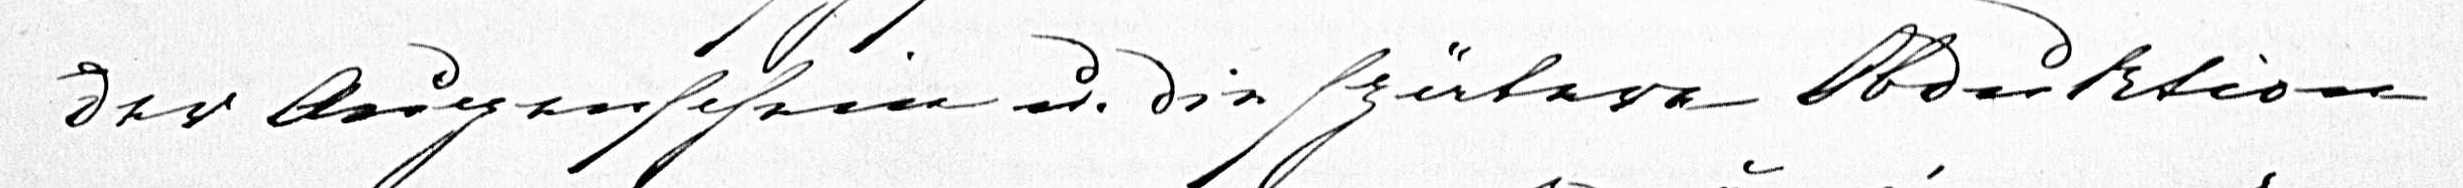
Der Augenschein u. die spätere Obduktion
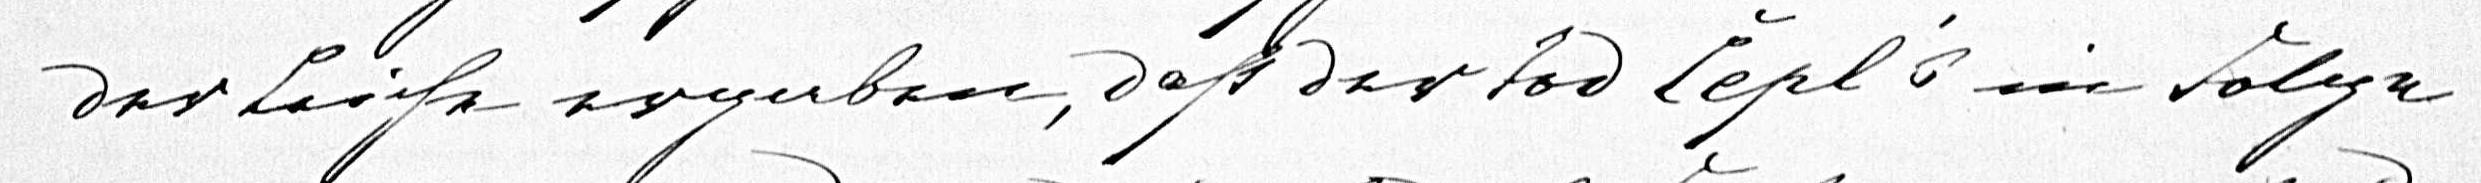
der Leiche ergaben, daß der Tod Čepl's in Folge
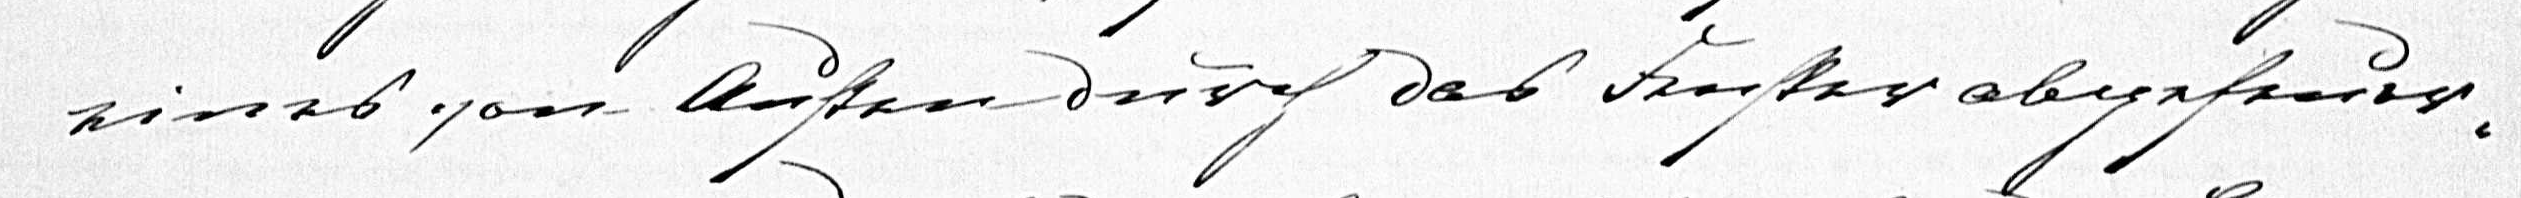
eines von Außen durch das Fenster abgefeuer¬
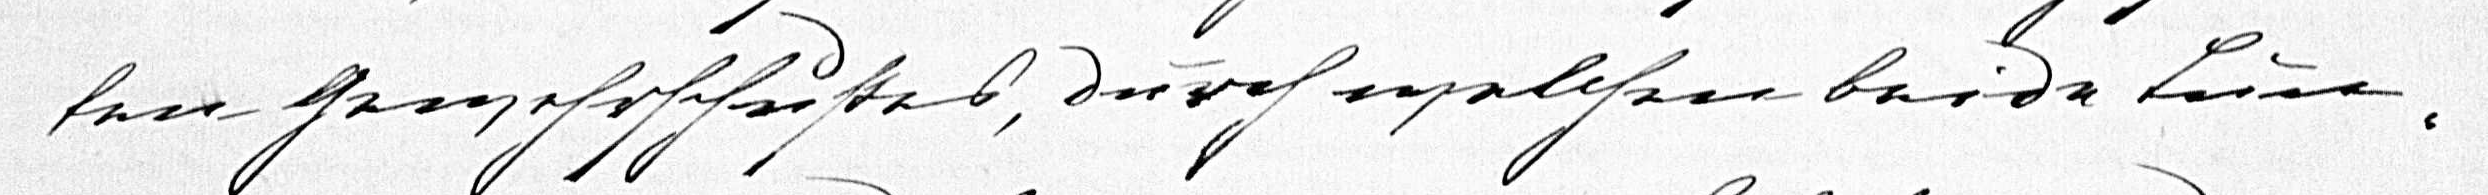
ten Gewehrschusses, durch welchen beide Lun¬
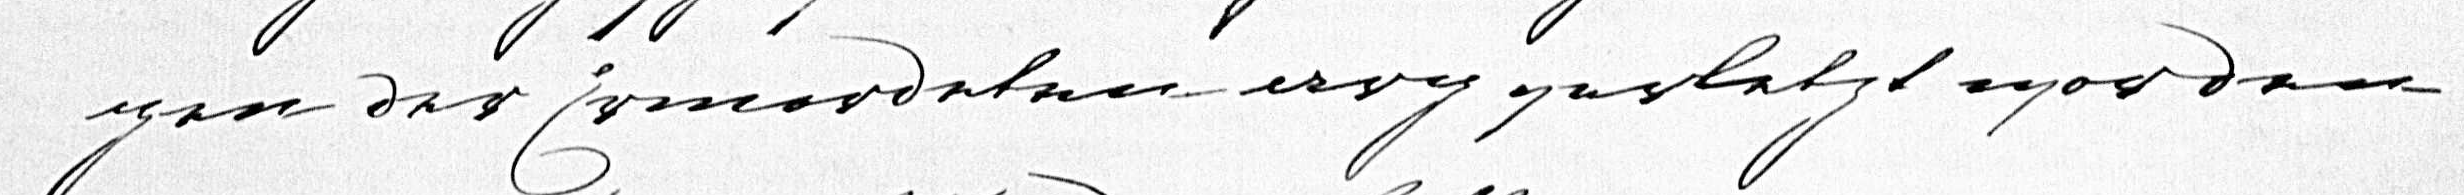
gen der Ermordeten arg verletzt worden
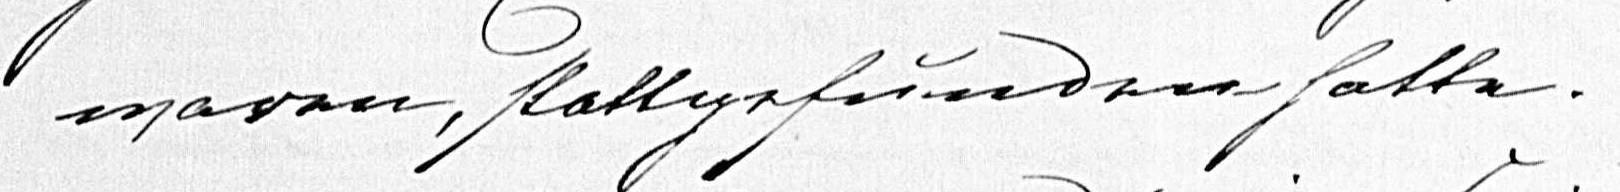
waren, stattgefunden hatte.
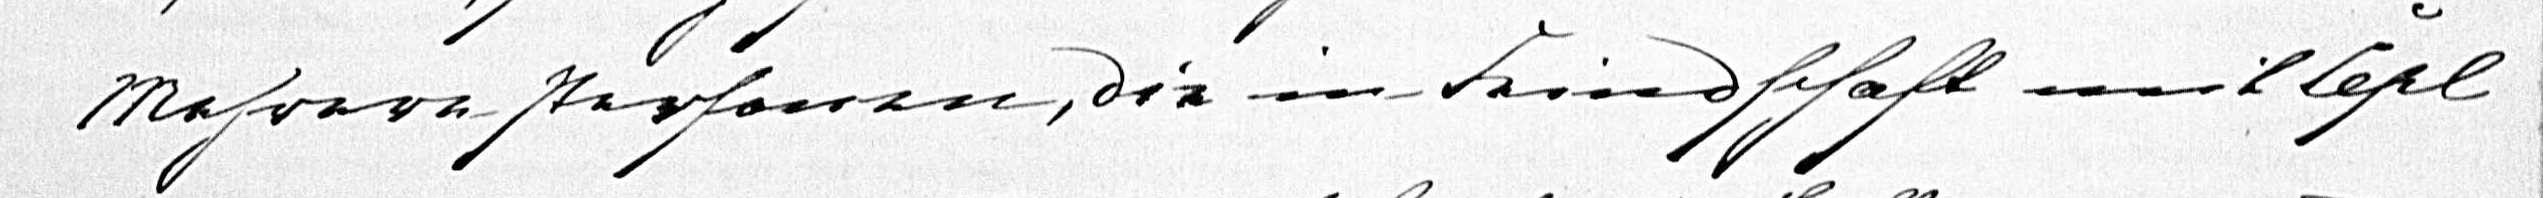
Mehrere Personen, die in Feindschaft mit Čepl
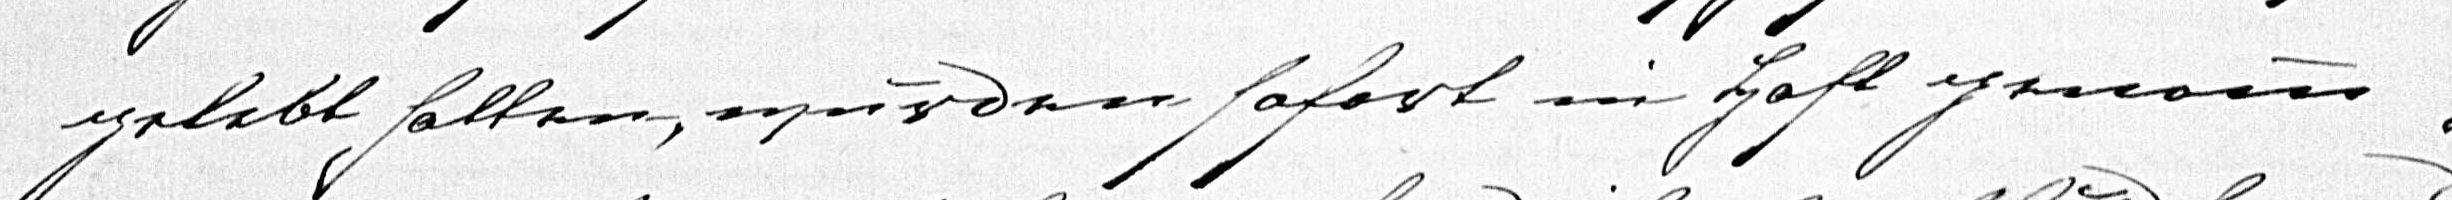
gelebt halte, wurden fahrt in Haft genomm¬
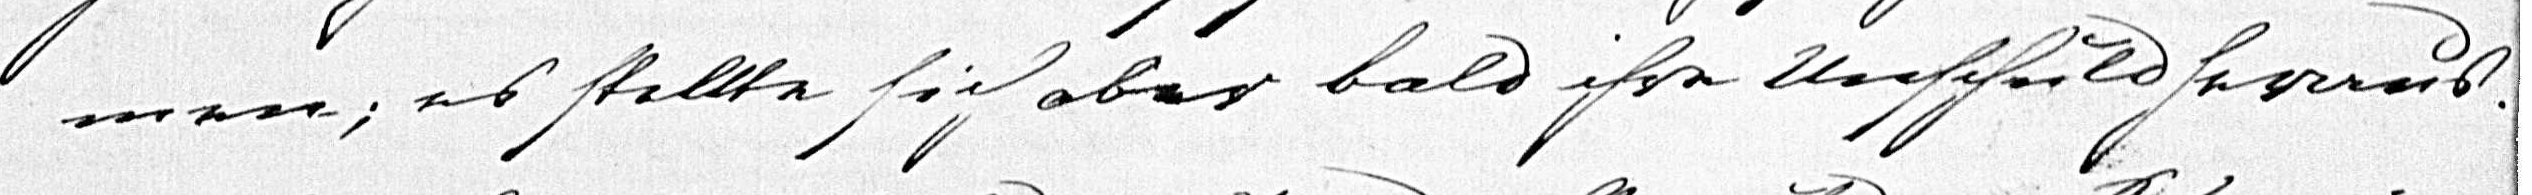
men; es stellte sich ober bald ihre Unschuld heraus.
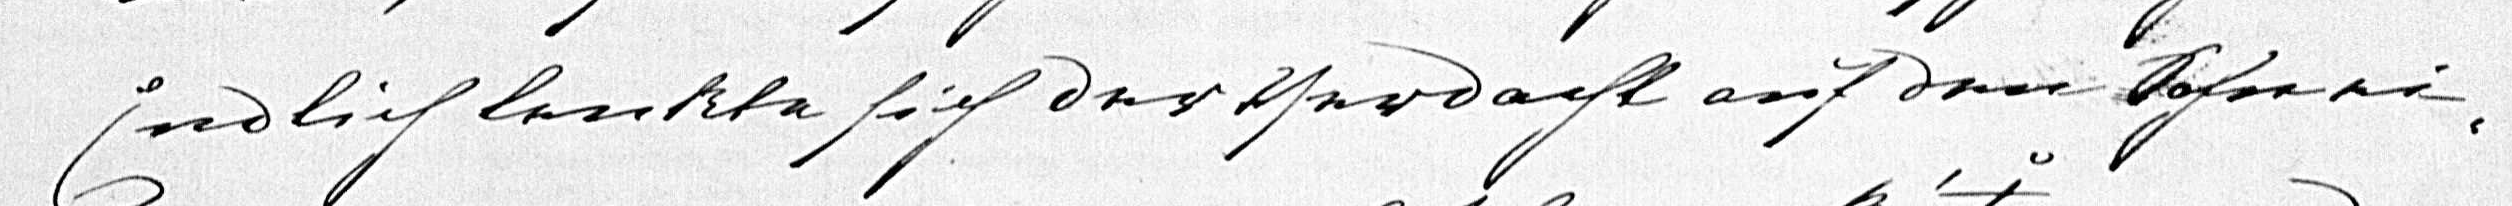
Endlich lenkte sich der Verdacht auf den Sohn ei¬
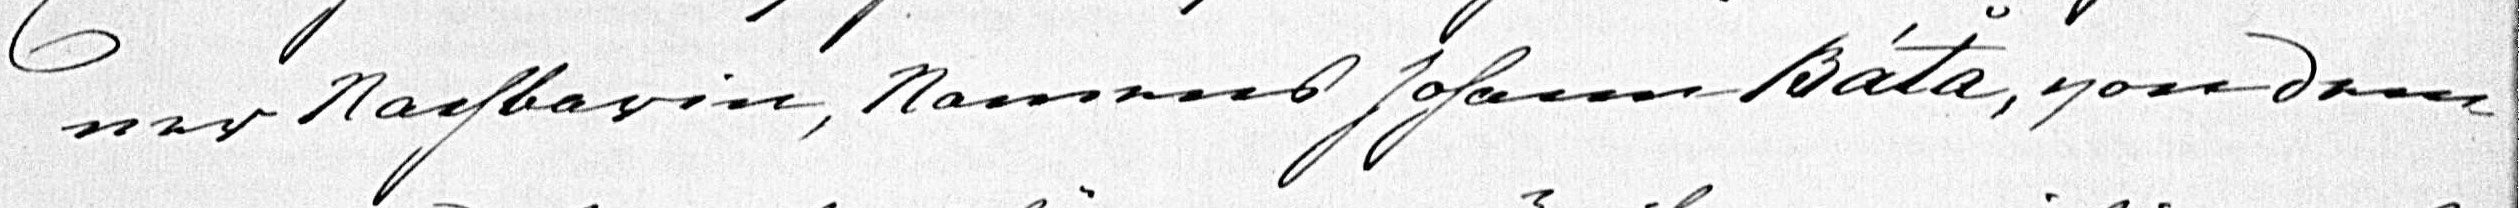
ner Nachbarin, Namens Johann Báta, von dem
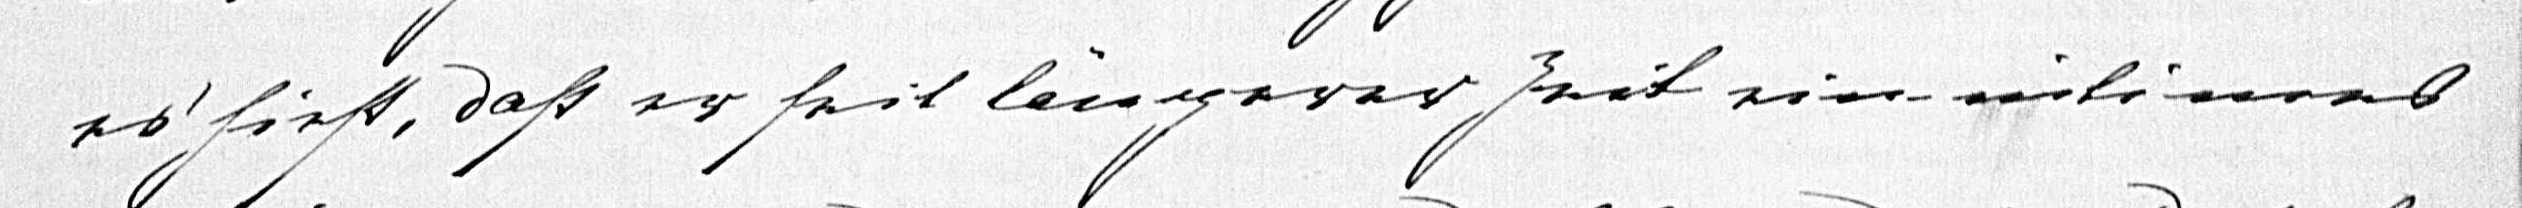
es hieß, daß er seit längerer Zeit ein -xx
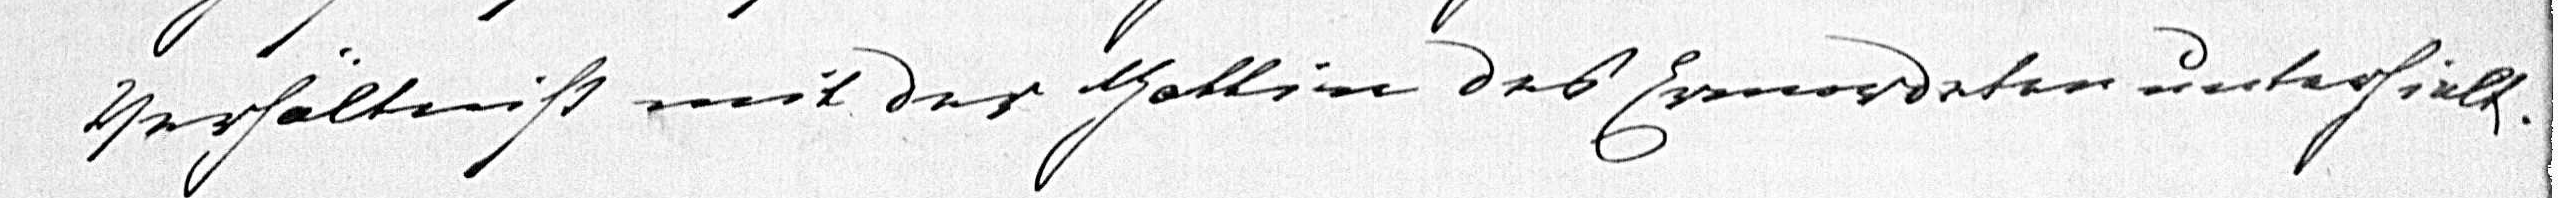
Verhältniß mit der Gattin des Ermordeten unterhielt.
